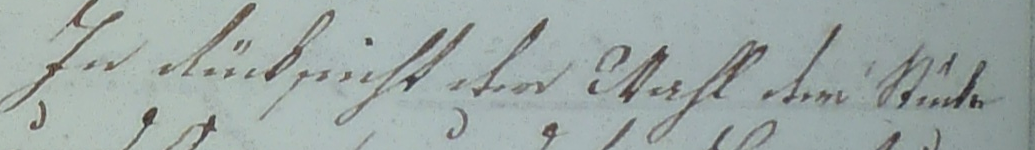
In Rücksicht der Wahl der Stücke
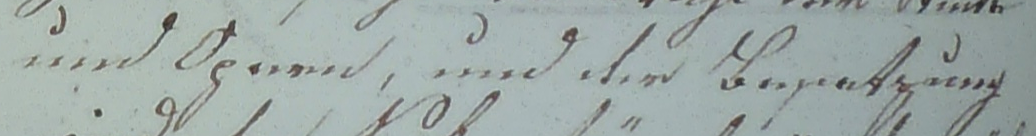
und Opern, und der Besetzung
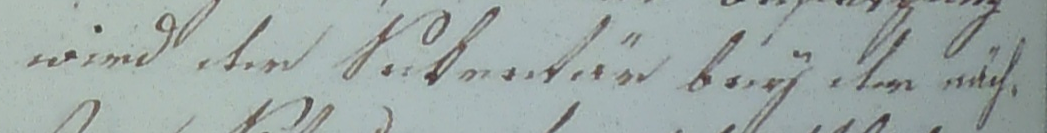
wird der Sekretär bey der näch¬
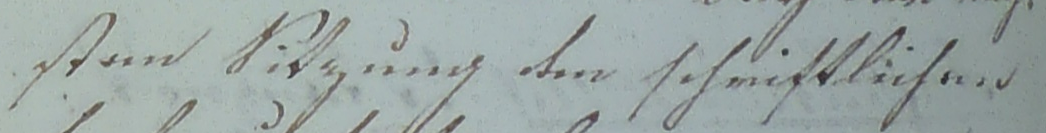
sten Sitzung den schriftlichen
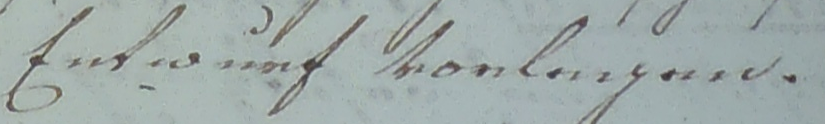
Entwurf vorlegen.
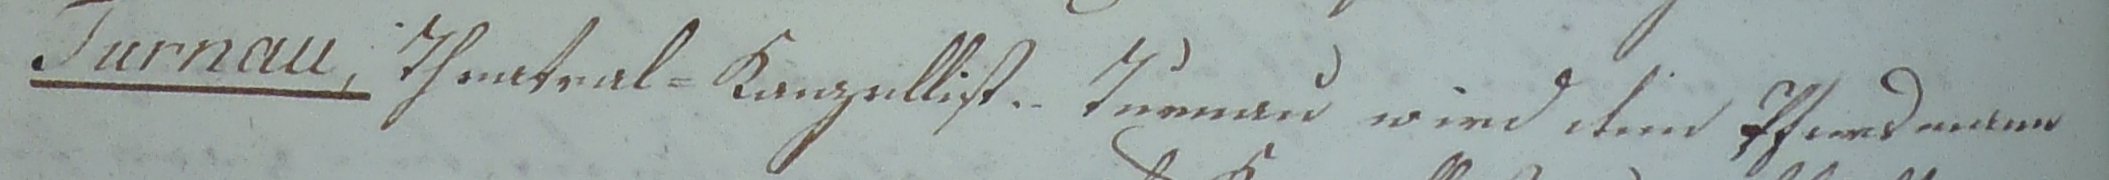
Turnau, Theatral=Kanzellist .. Turnau wird dem Pfersmann
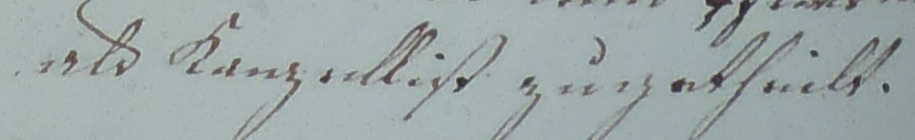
als Kanzellist zugetheilt.
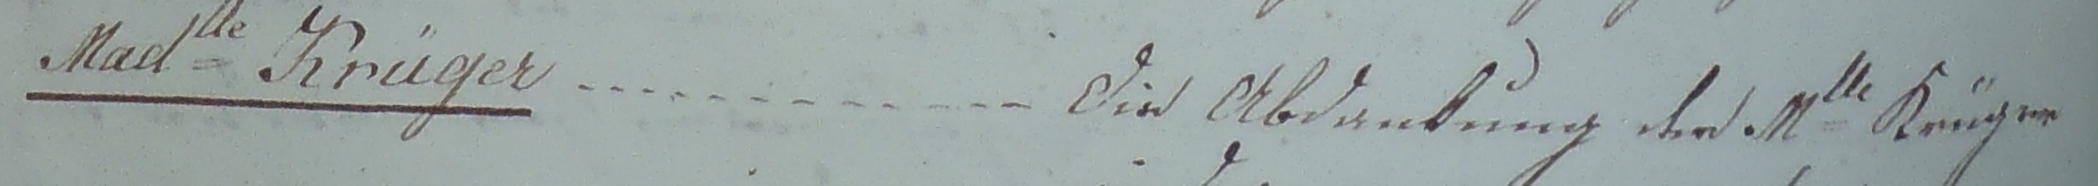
Madl͇l͇e Krüger ………… Die Abdankung der Ml͇l͇e Krüger
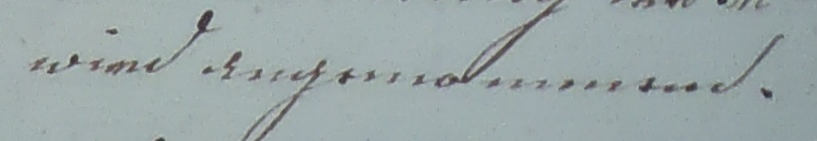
wird angenommen.
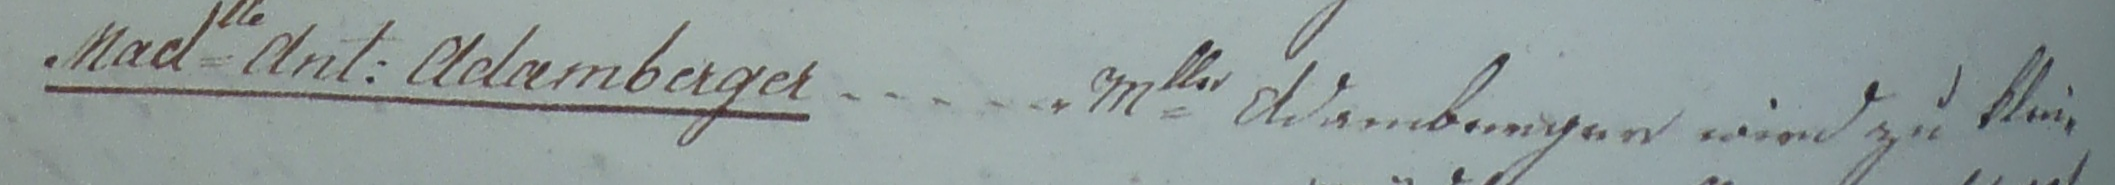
Madl͇l͇e Ant: Adamberger …… ,, Mll͇e Adamberger wird zu klei¬
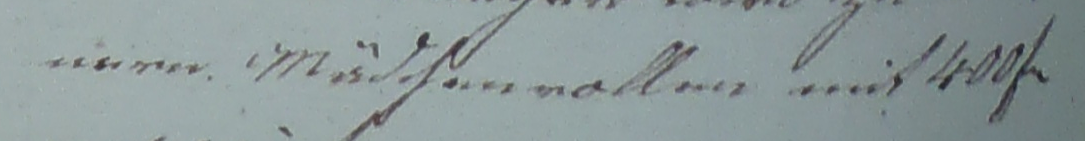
nern Mädchenrollen mit 400fn
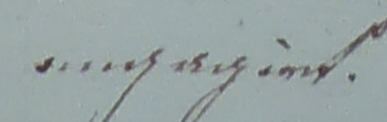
engagirt.
